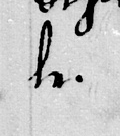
len¬
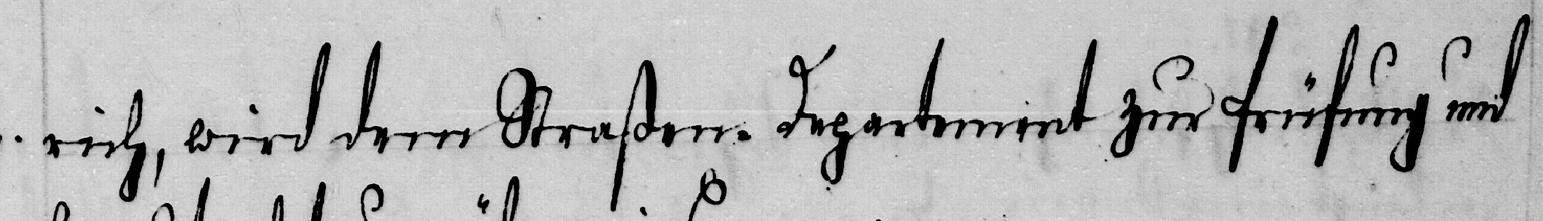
rich, wird dem Straßen-Departement zur Prüfung und
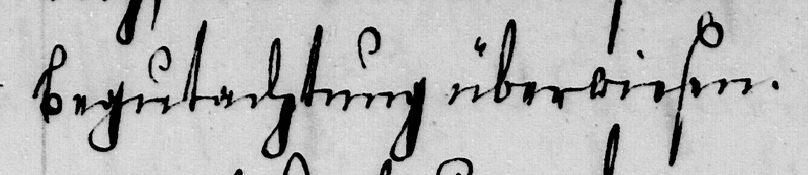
Begutachtung überwiesen.
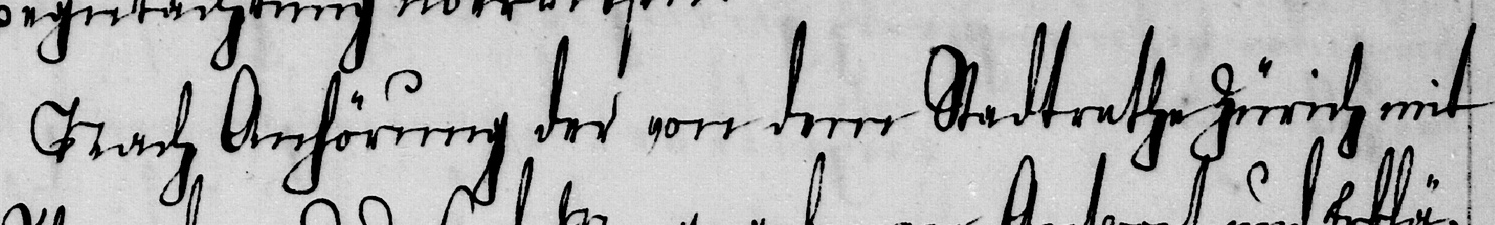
Nach Anhörung der von dem Stadtrathe Zürich mit
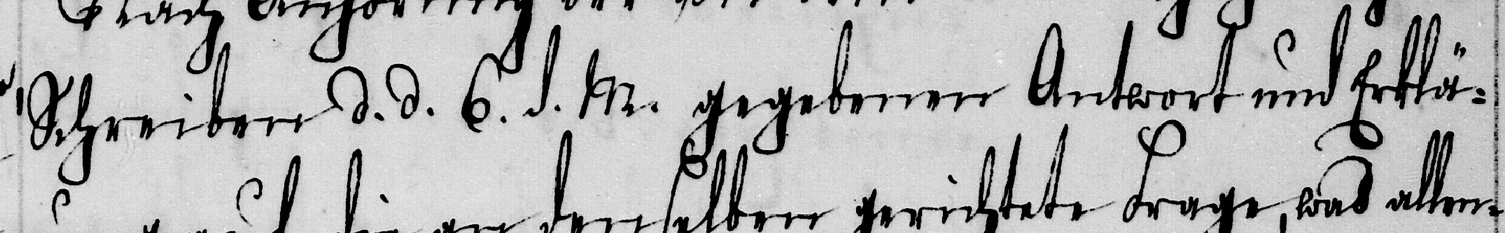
Schreiben d. d. 6. d. M. gegebenen Antwort und Erklä¬
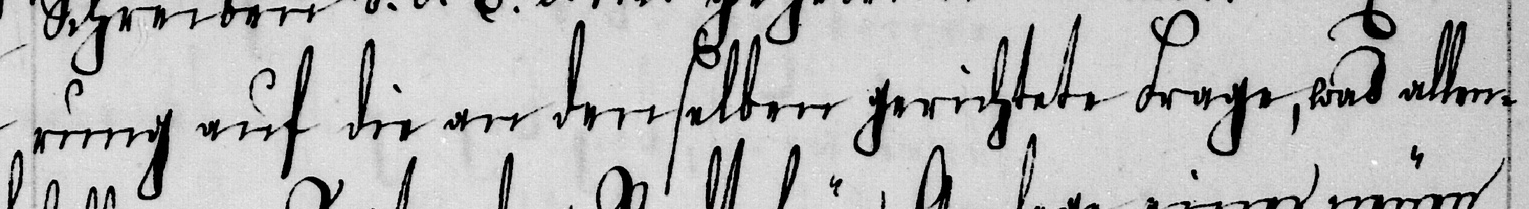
rung auf die an denselben gerichtete Frage, was al¬
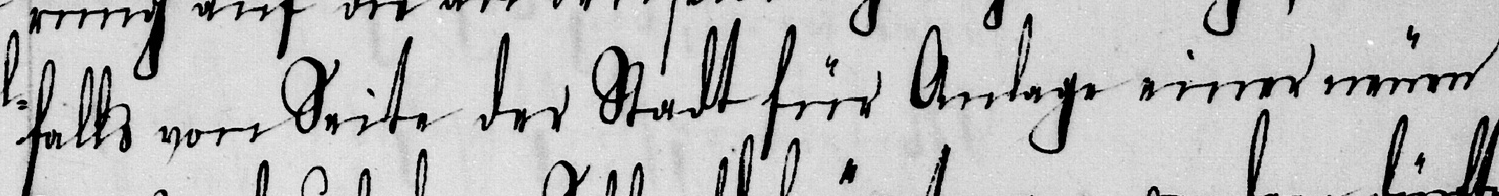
falls von Seite der Stadt für Anlage einer neuen
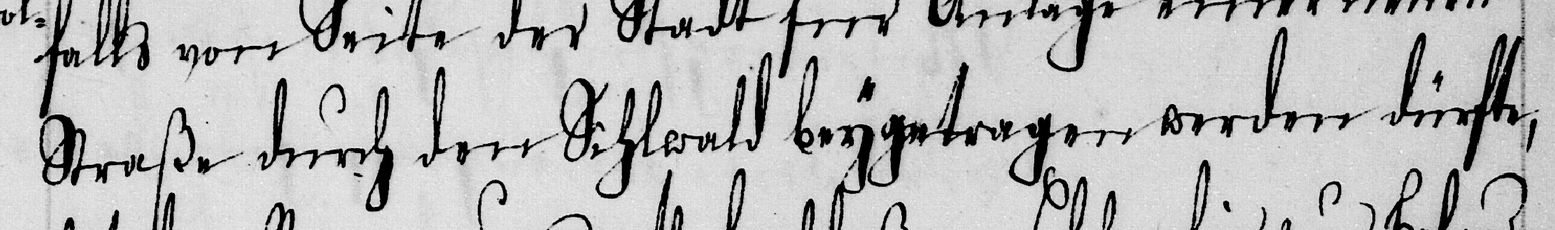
Straße durch den Sihlwald beygetragen werden dürfte,
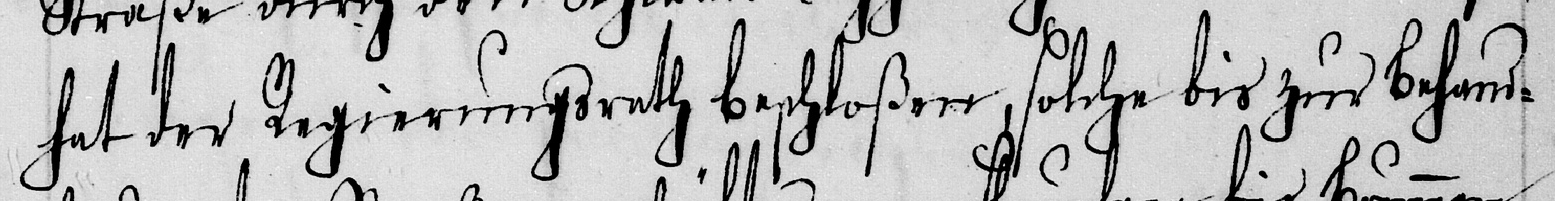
hat der Regierungsrath beschloßen, solche bis zur Behand¬
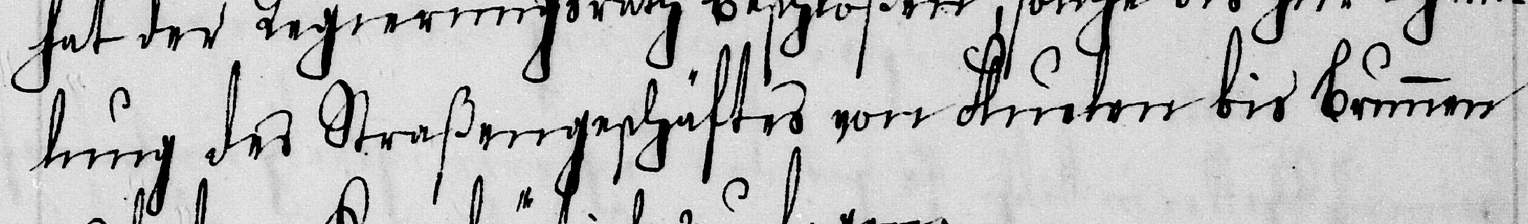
lung des Straßengeschäftes von Fluelen bis Brunnen
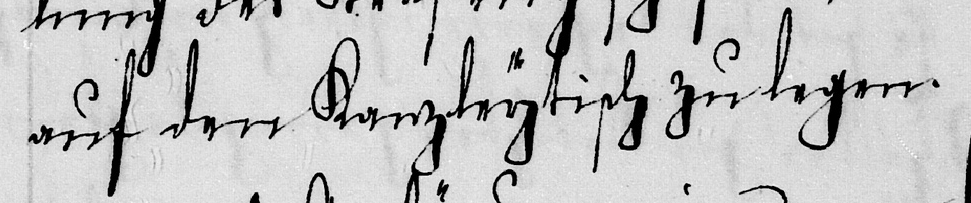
auf den Kanzleytisch zu legen.
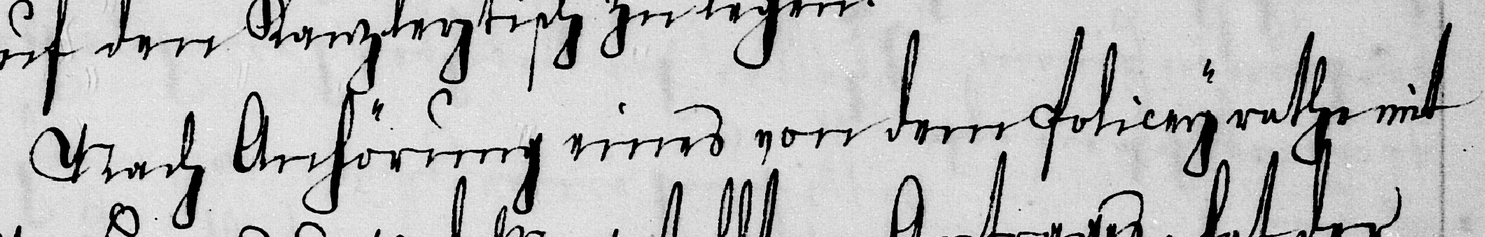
Nach Anhörung eines von dem Policeyrathe mit
